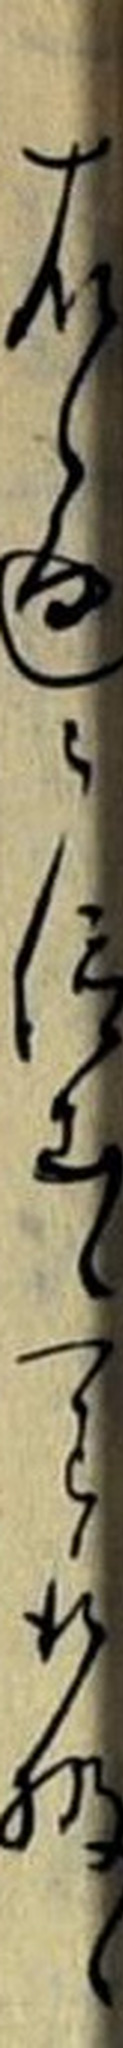右之通被仰出候可被取扱候
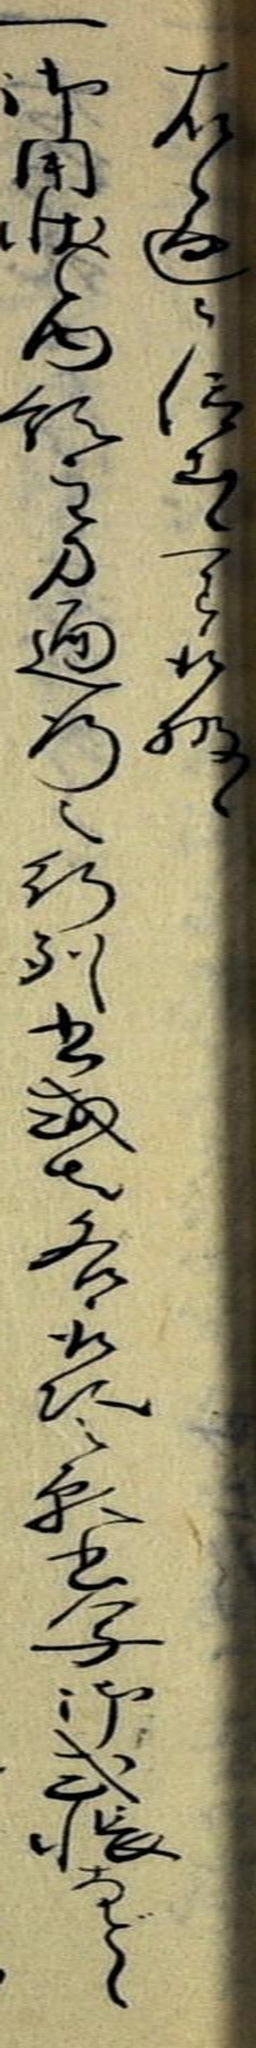一御用状之内領主方通行之行列書或者各取次之願書写御式帳などゝ
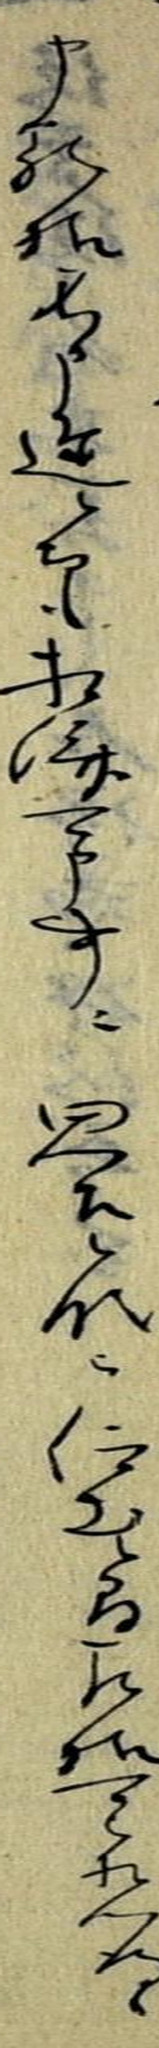申類様不申達候而も相済可申事ニ思召候段被仰出候間左様可被相心得候
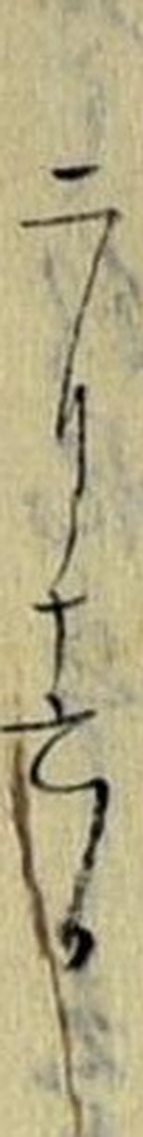二月十六日
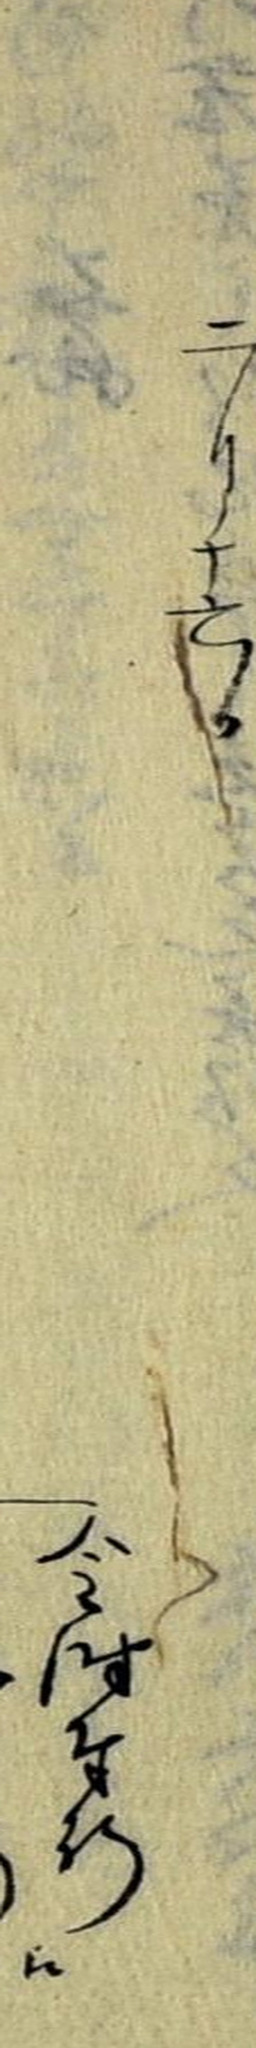金津奉行
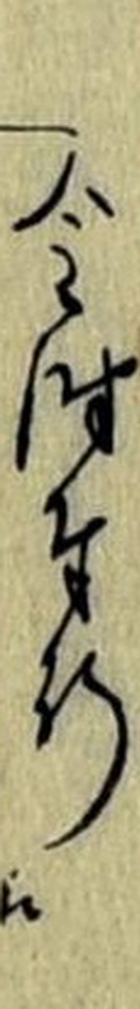金津奉行
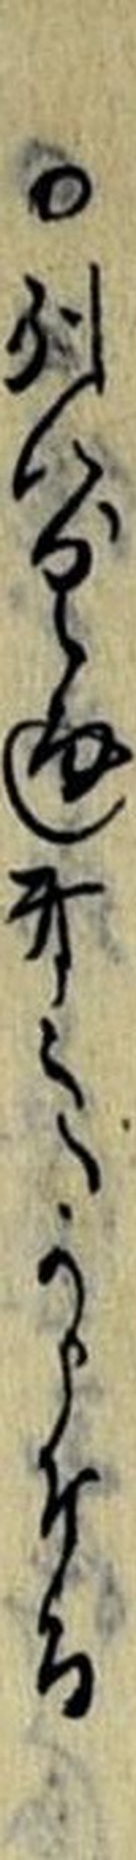〇別紙之通村々へ可申付旨
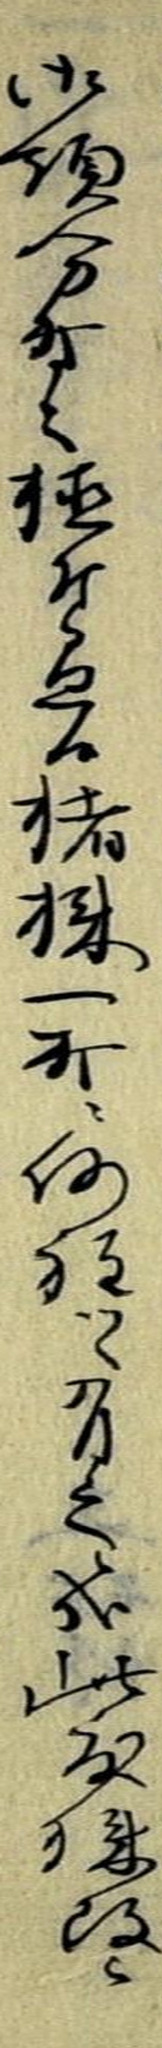御領分村々植付置候楮株一村ニ何程ツヽ有之候哉此度株改被
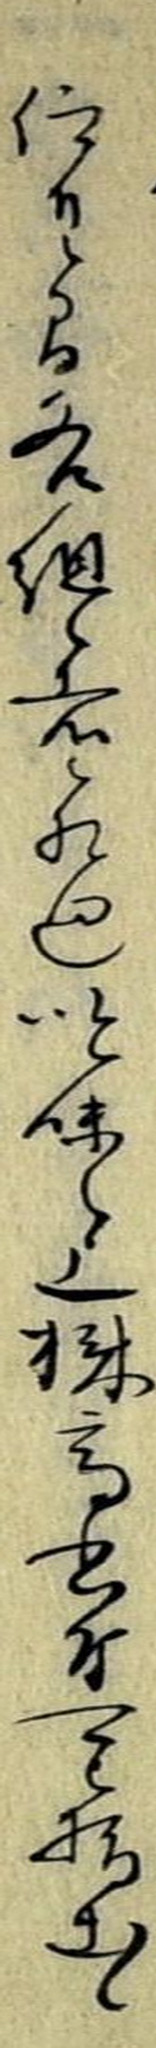仰付候間各組之者被相廻吟味之上株高書付可被指出候
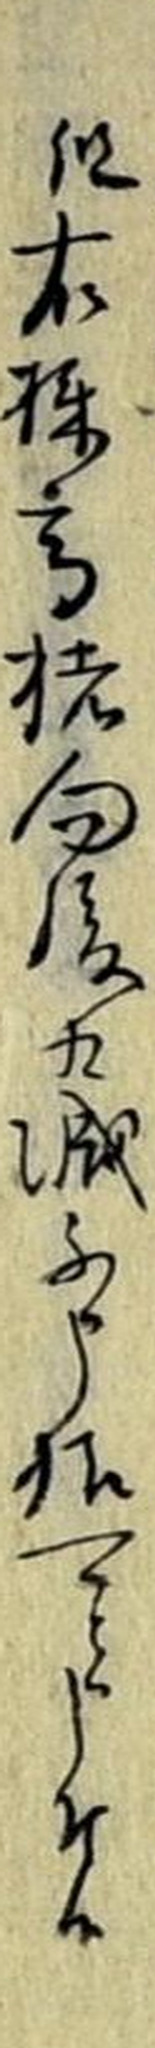但右株高楮向後相減不申様可被申付候
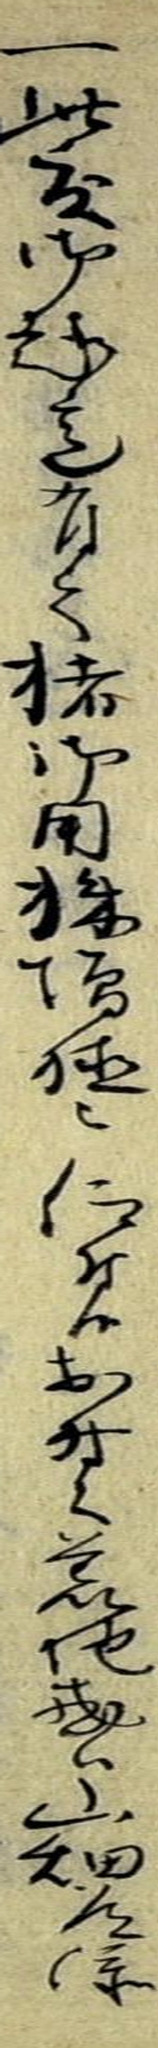一此度御趣意有之楮御用株増植被仰付候於村々荒地或ハ山畑道添
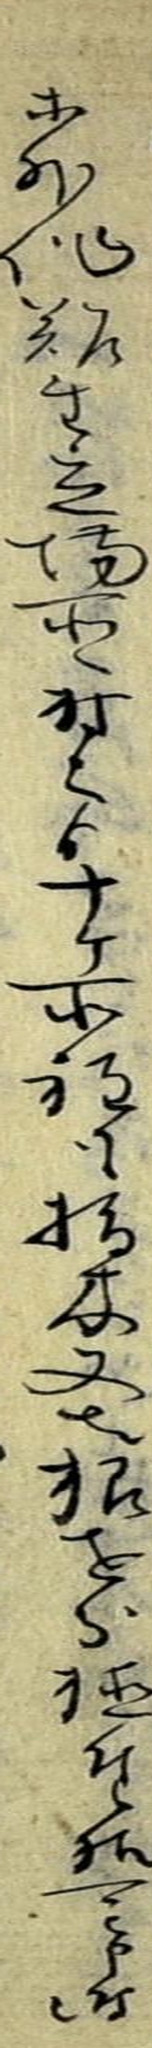等外作難生立場所へ村々ゟ十ケ所程ツヽ指木又者根を分植付候様可被申付候
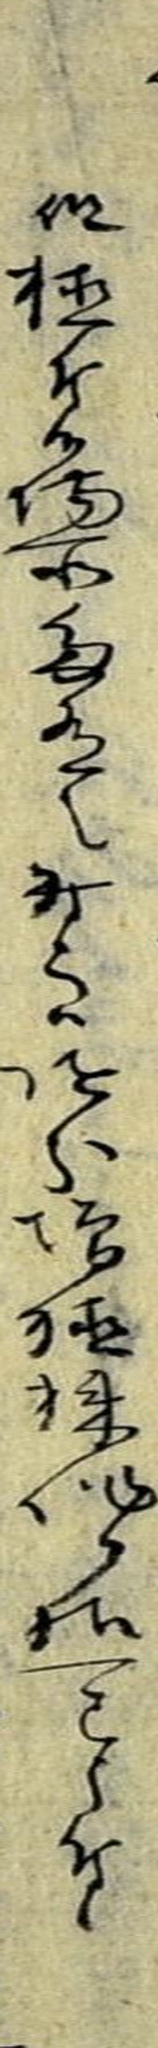但植付候場所多有之村々ハ随分増植株作候様可被申付候
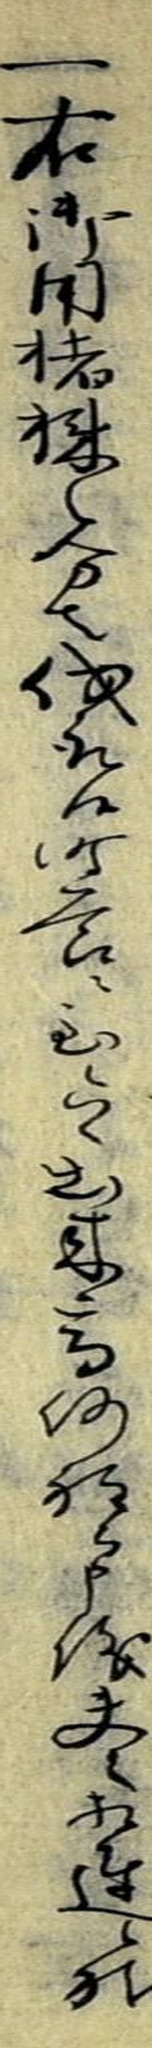一右御用楮株之分者伐取候時節ニ至候ハヽ出来高何程与申儀夫々相達候様
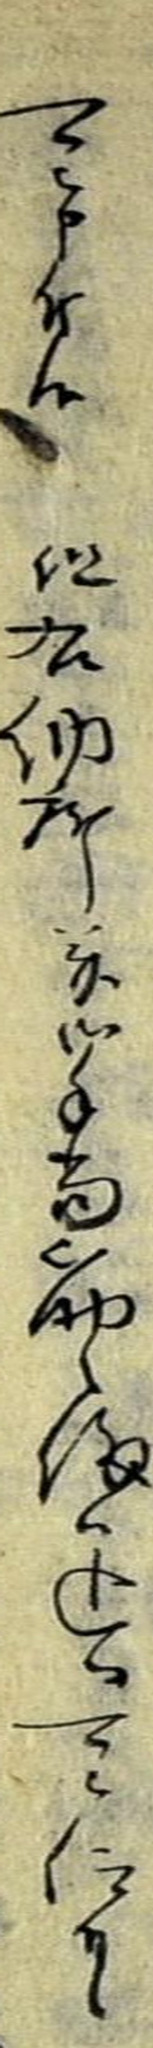可被申付候但右納所并御手当筋之儀ハ追而可被仰付候
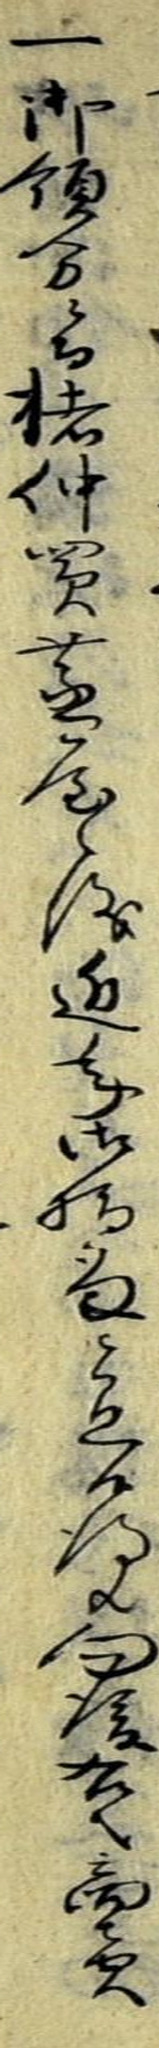一御領分ニ而楮仲買蒸屋之儀近年御指留被置候得共向後右之商売
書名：命令之部 三
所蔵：福井県文書館 Fukui Prefectural Archives
